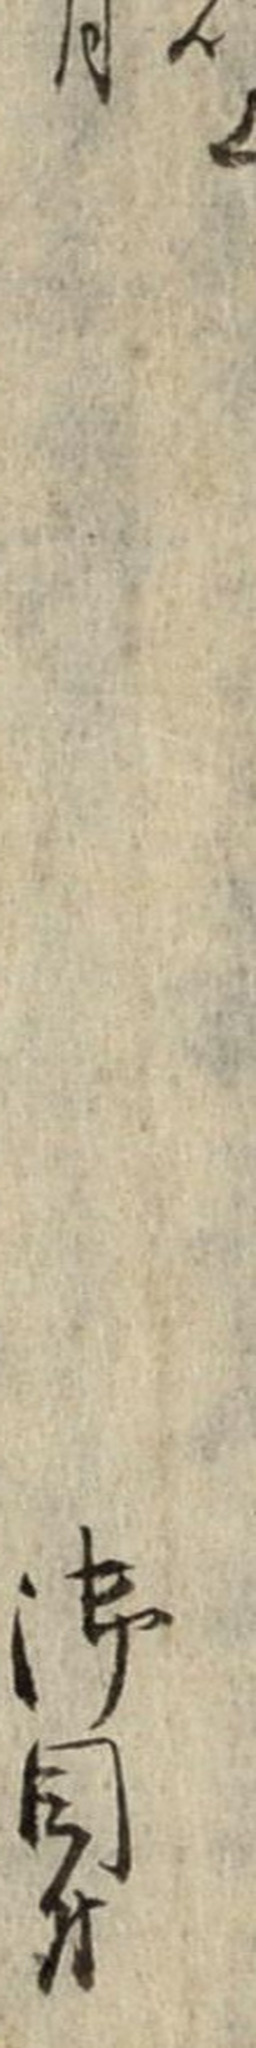月御目付
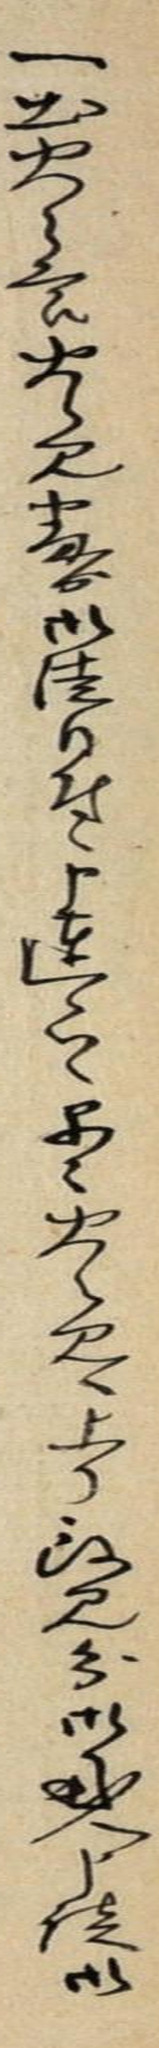一出火之節火之見番ゟ御徒目付へ申達候はゝ早々火之見へ上り致見分御用人申談御
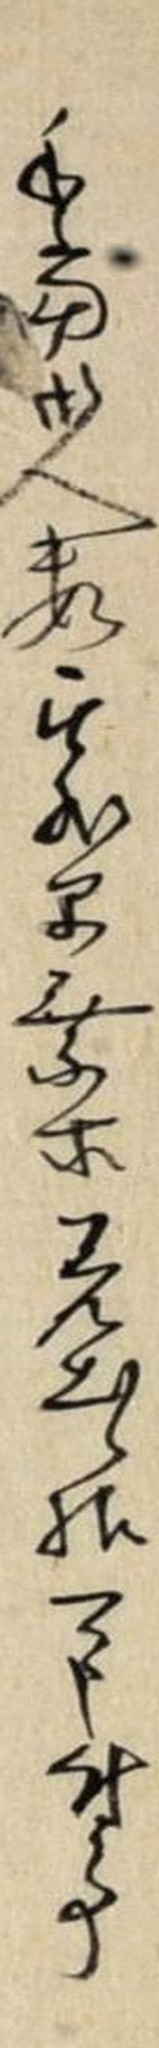手当御人数其外早乗等差出候様可申付事
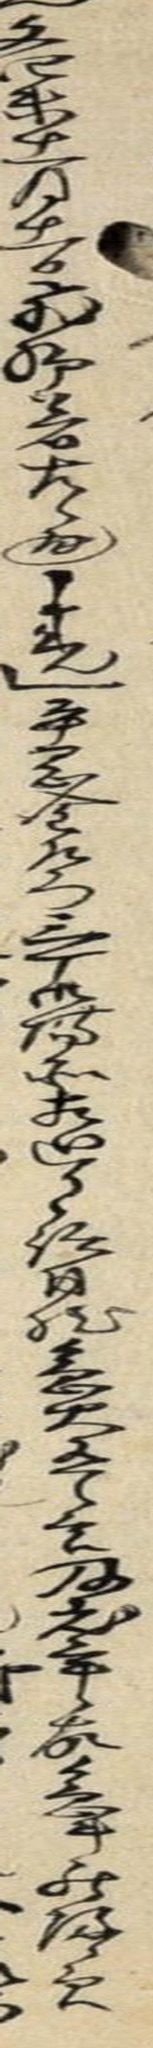一元文四未十一月十一日飛脚着左之通申来る」平岡金左衛門三丁御場所相廻り候跡自然急火有之節及老年候故急き罷帰候ては
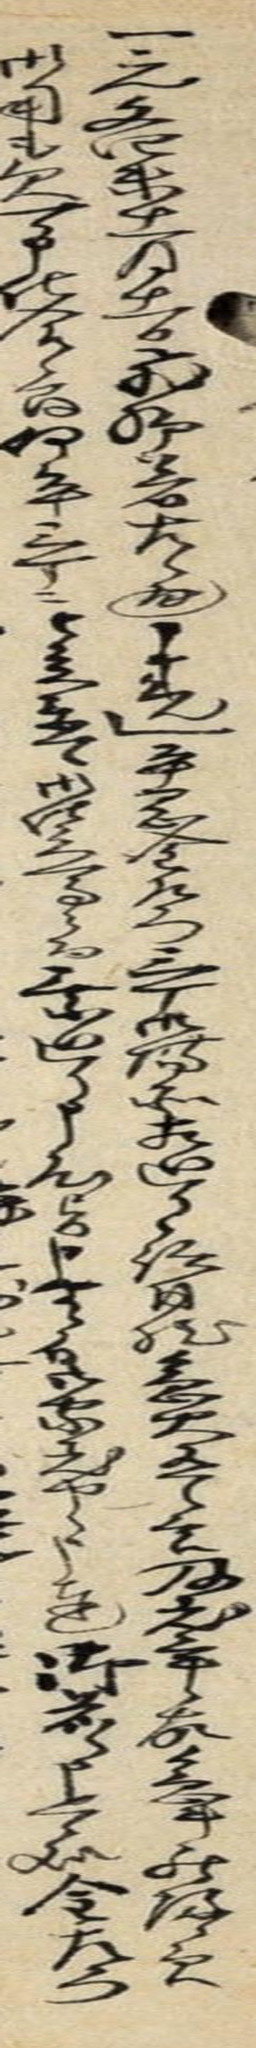御用も欠可申仕合候間何卒三丁に被立置候御貸馬にて乗廻り申度旨申聞候に付御家老中へ申達御前へ申上候処金左衛門
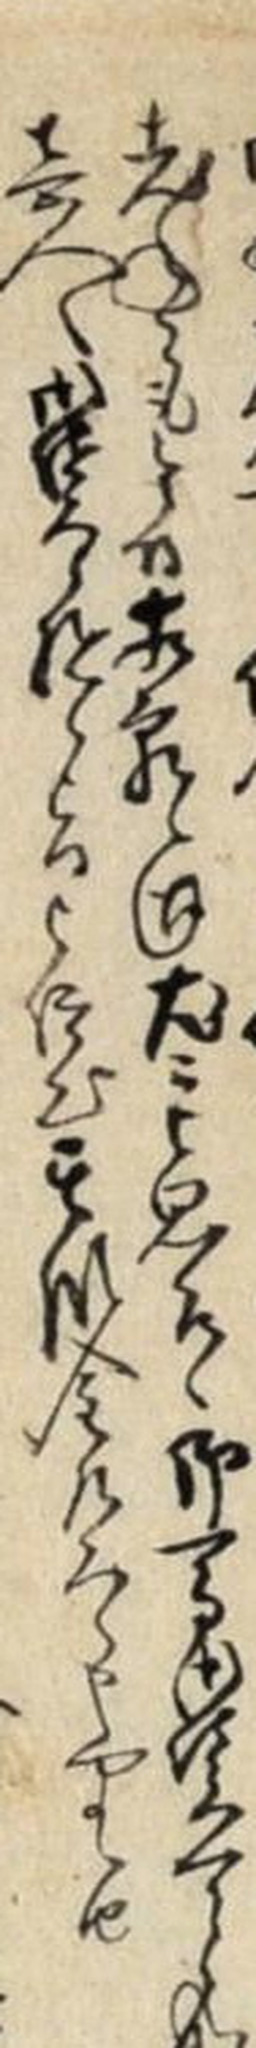壱人へ御貸被遊候旨被仰出其段金左衛門へ申聞候由
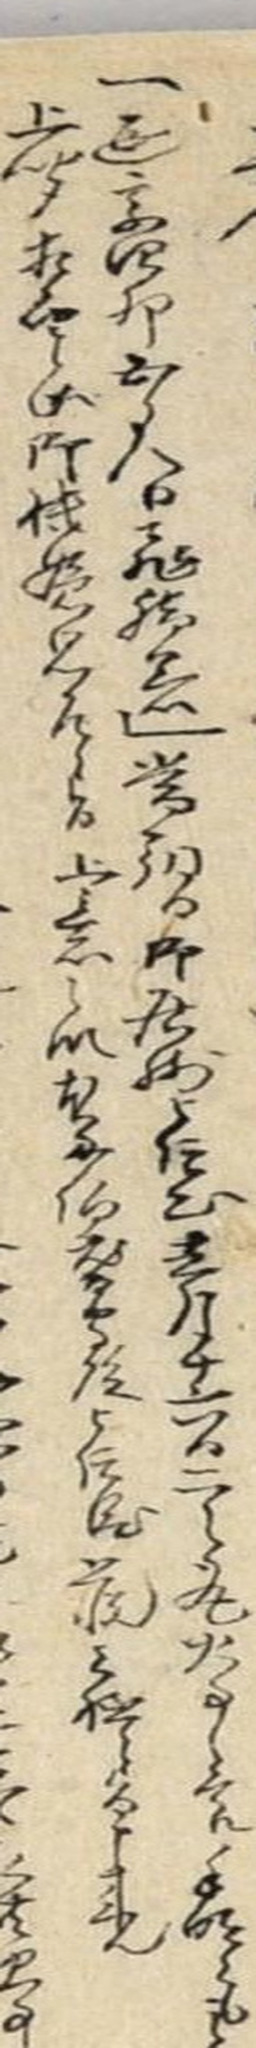上聞相届候趣御機嫌思召候旨上之意之段本多伯耆守殿被仰渡恐悦至極之旨申来る
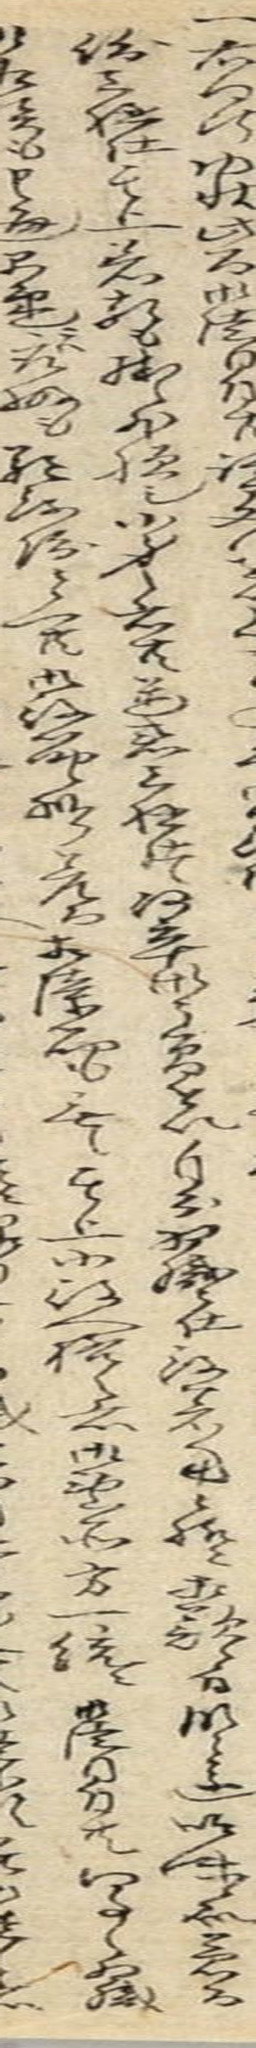御相談も申候通早速には取扱も難致儀に候へ共御役筋之掛り差て相障筋も無之其上小役人各之者御台所方一統に御徒目付共同事之羽織
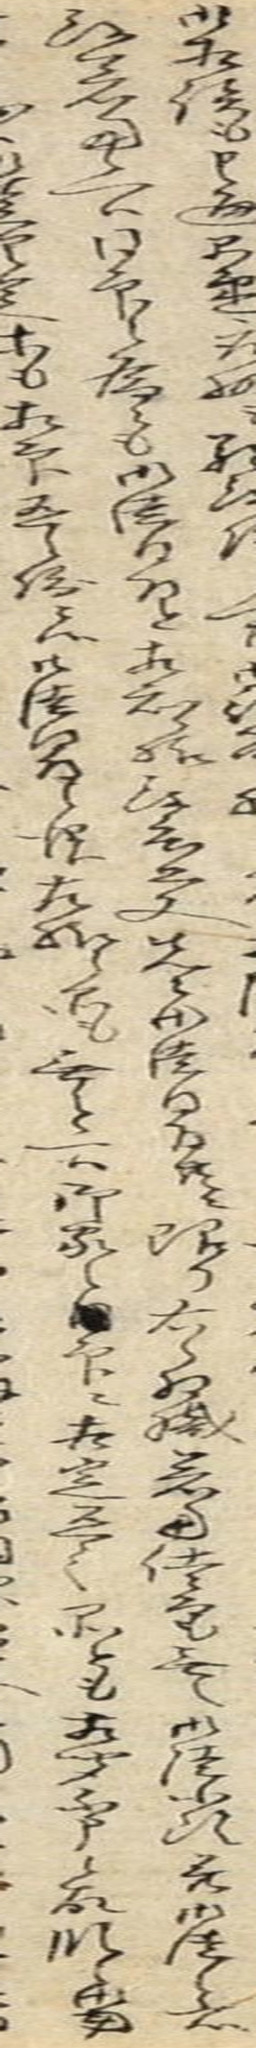共之儀は御貸具足等も相印有之儀に候御徒目付之儀左様之品も無之候へは御家之目印に相定有之品とも相聞不申候故段々御用
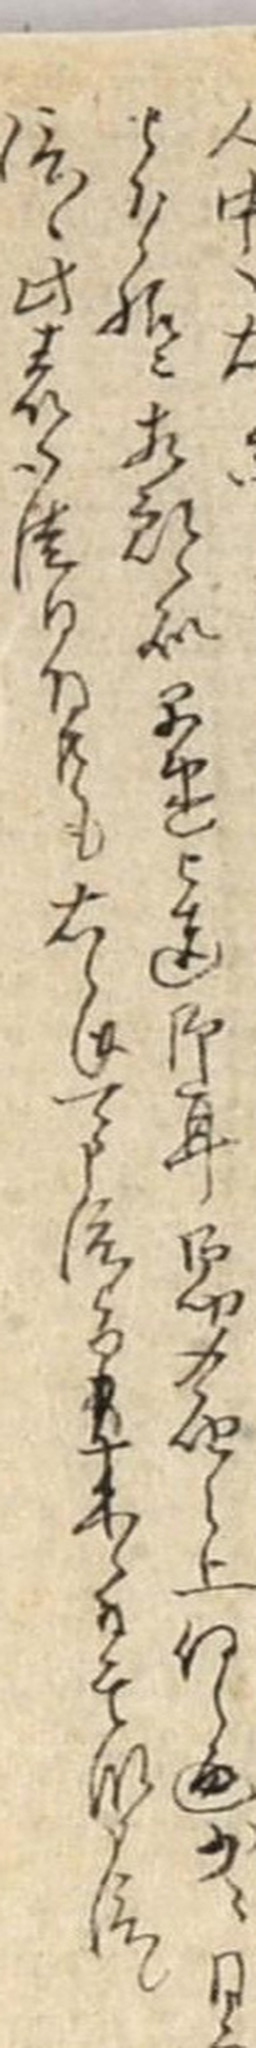渡候此表御徒目付共へも右之趣可申渡旨申来候付其段申渡候

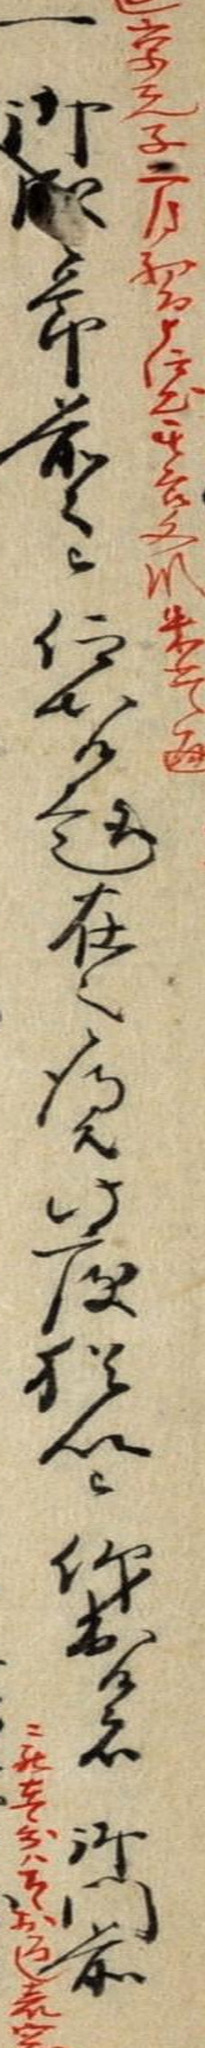一御成之節前々被仰出候趣在之候得共此度猶以被仰出候は御門前
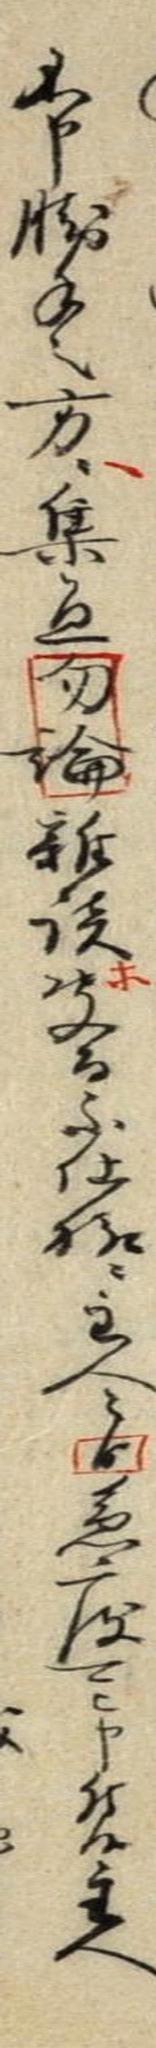不申勝手之方へ集置「勿論」雑談等決て不仕様に主人に「ゟ」急度可被申付候主人
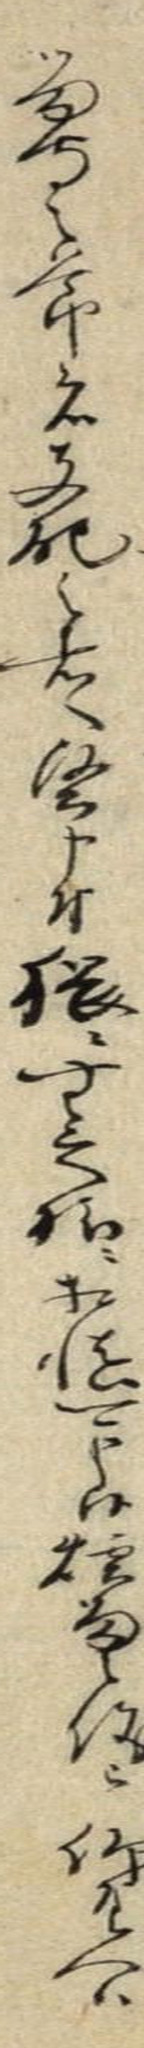留守之節は支配之者へ堅申付猥に無之様に相慎可申候煙留之儀被仰付候へは
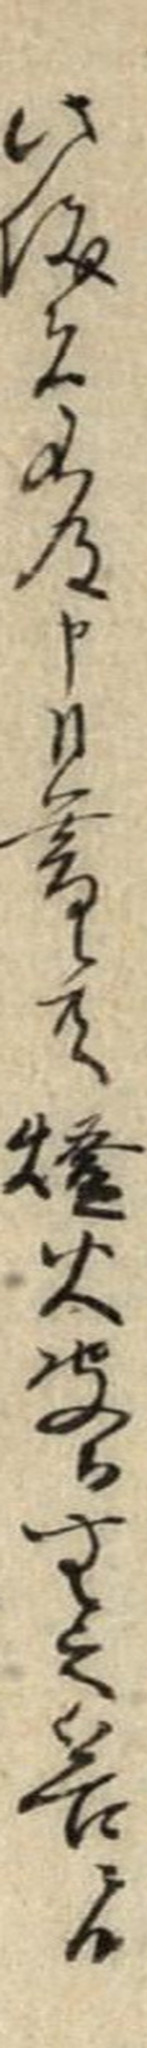此儀は不及申日暮候共燈火決手無之筈に候
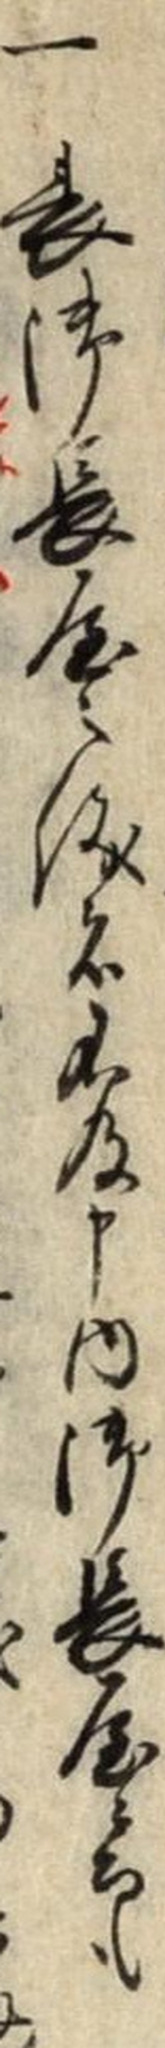一表御長屋之儀は不及申内御長屋にても
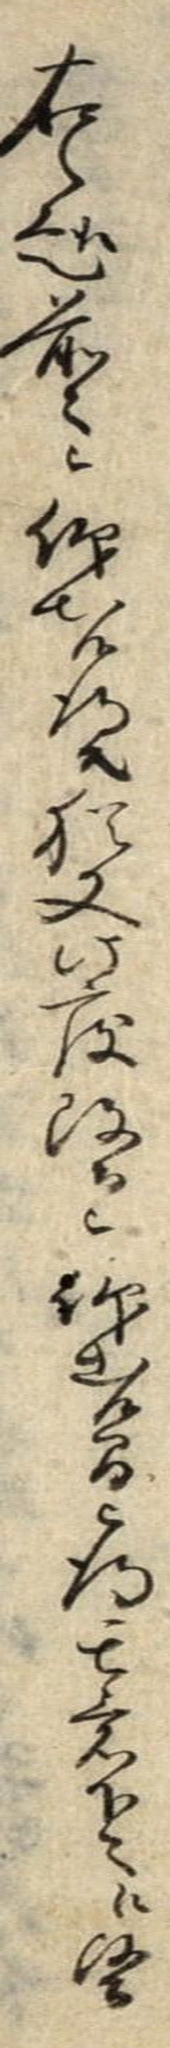右之趣前々被仰出候得共猶又此度改て被仰出候間被得其意下々江堅
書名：三都并道中之部
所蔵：福井県文書館 Fukui Prefectural Archives
